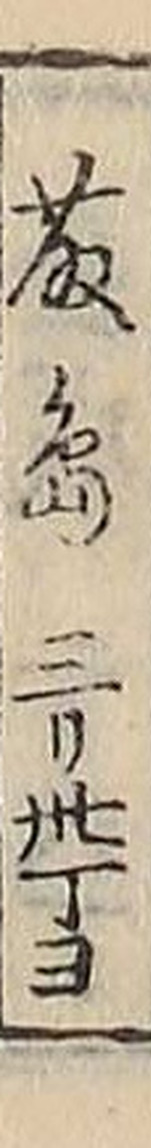藤島三リ卅丁ヨ
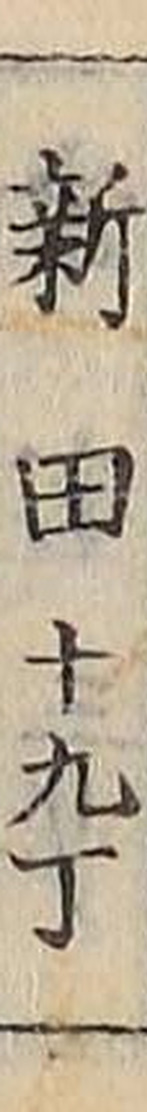新田十九丁
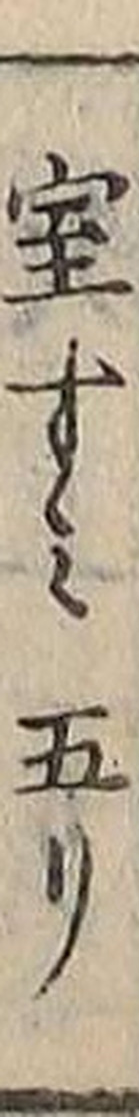室すみ五リ
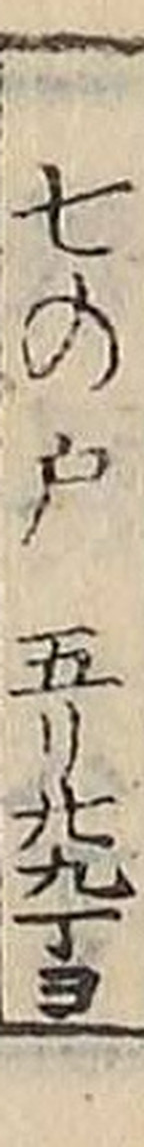七の戸五リ廿九丁ヨ
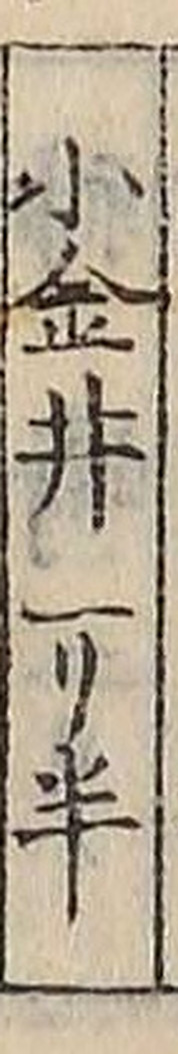小金井一リ半
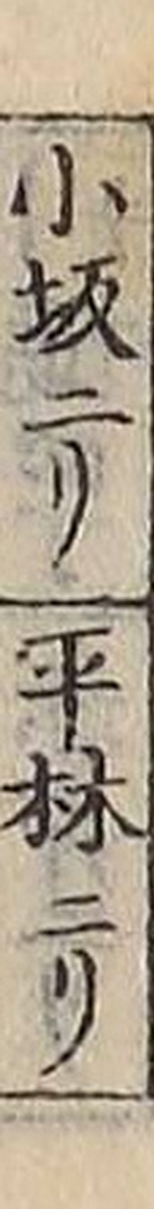小坂二リ平林二リ
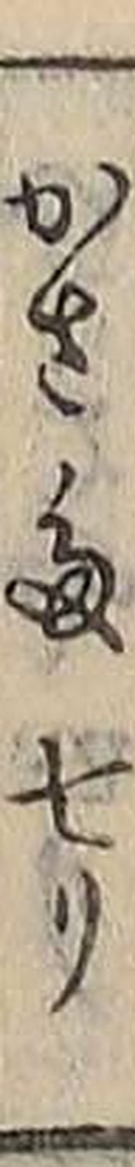かさた七リ
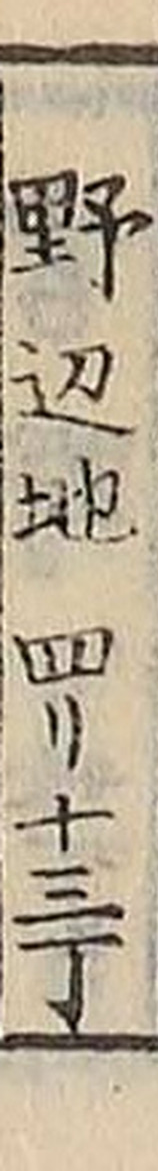野辺地四リ十三丁
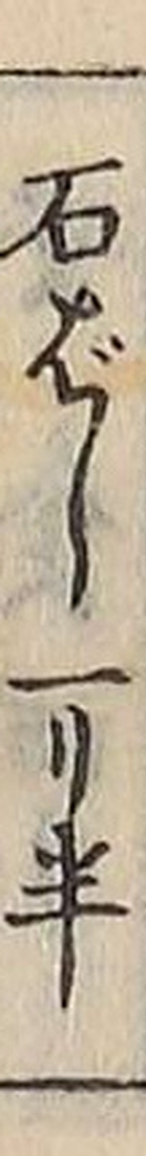石ばし一リ半
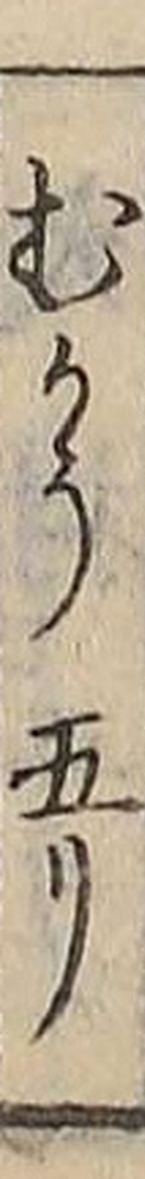むかう五リ
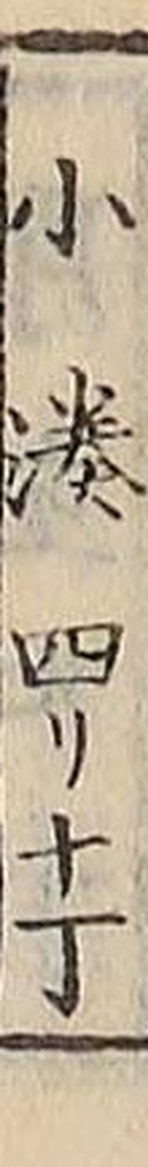小湊四リ十丁
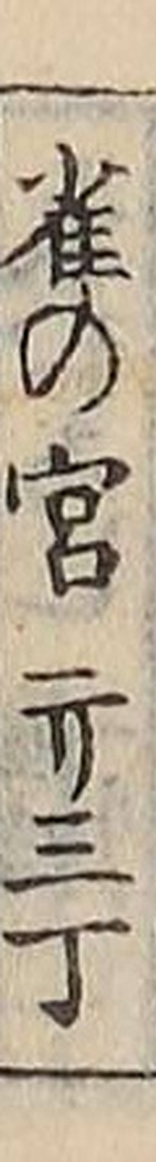雀の宮二リ三丁
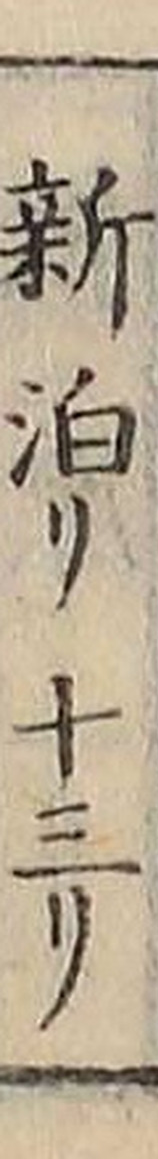新泊り十三リ
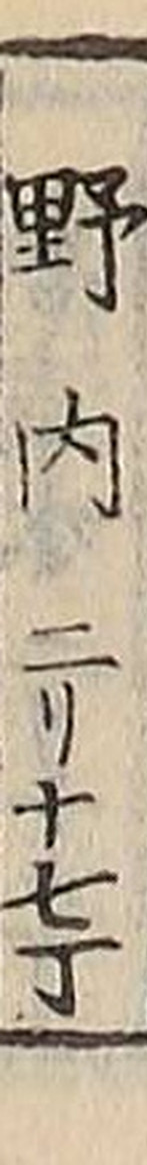野内二リ十七丁
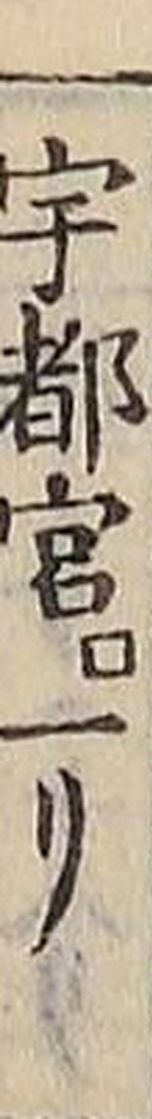宇都宮▫一リ
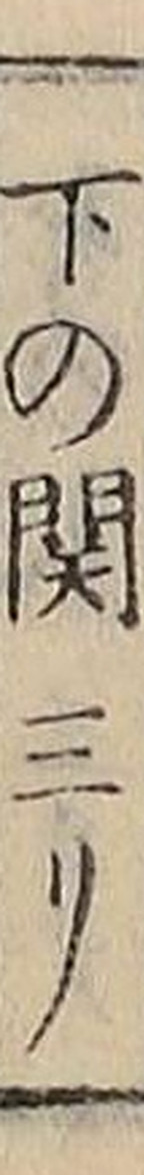下の関三リ
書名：旅行用心集
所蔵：神戸大学附属図書館 国文学研究資料館
